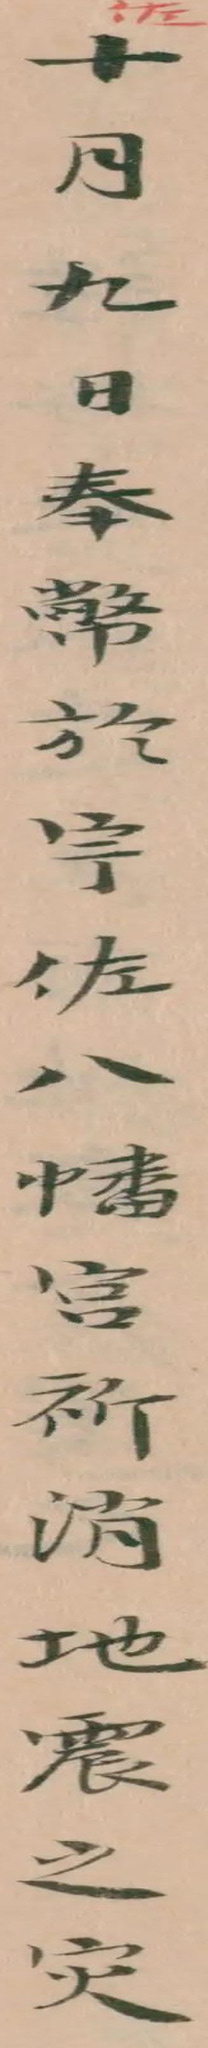十月九日奉幣於宇佐八幡宮祈消地震之灾
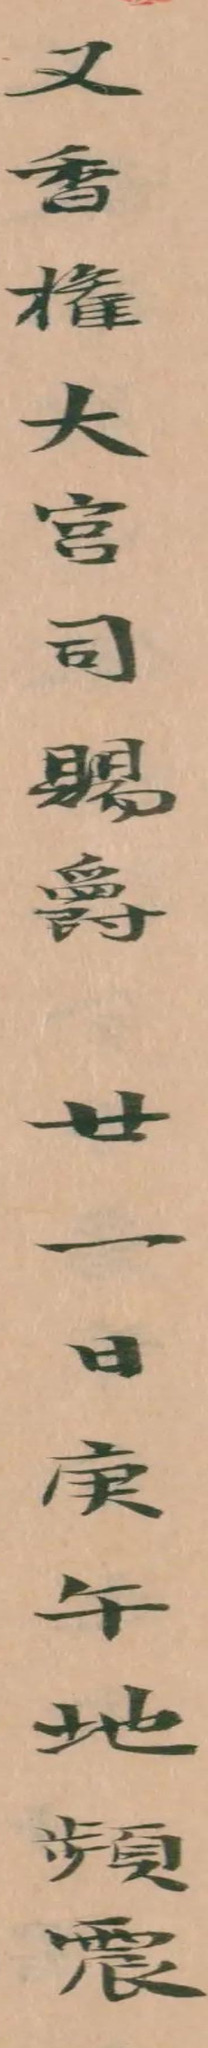又香権大宮司賜爵廿一日庚午地頻震
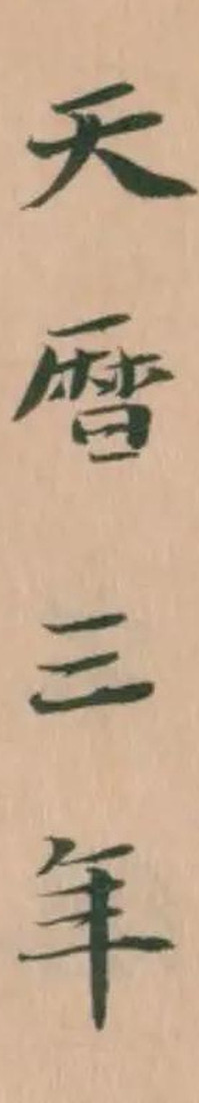天暦三年
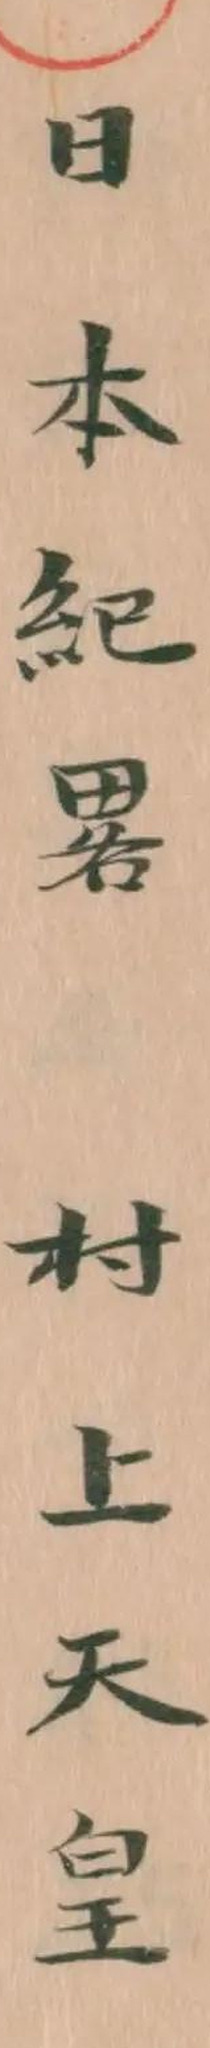○日本紀略村上天皇
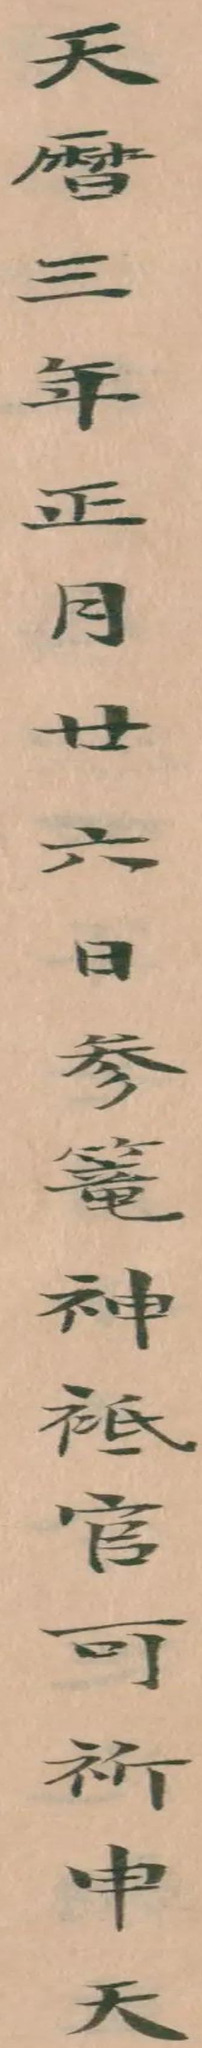天暦三年正月廿六日参籠神祗官可祈申天
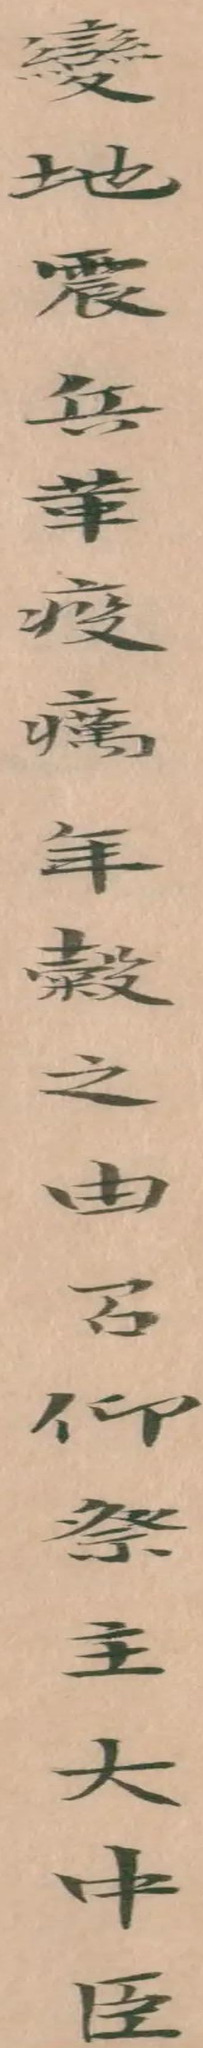変地震兵革疫癘年穀之由召仰祭主大中臣
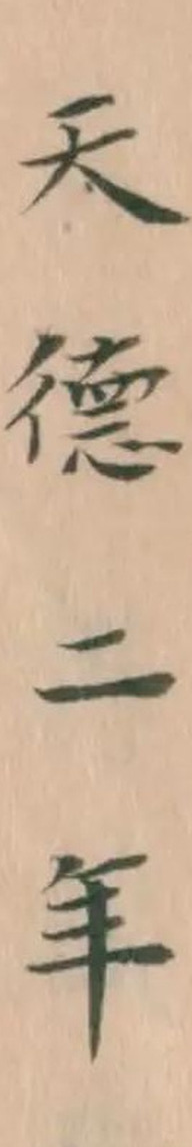天徳二年
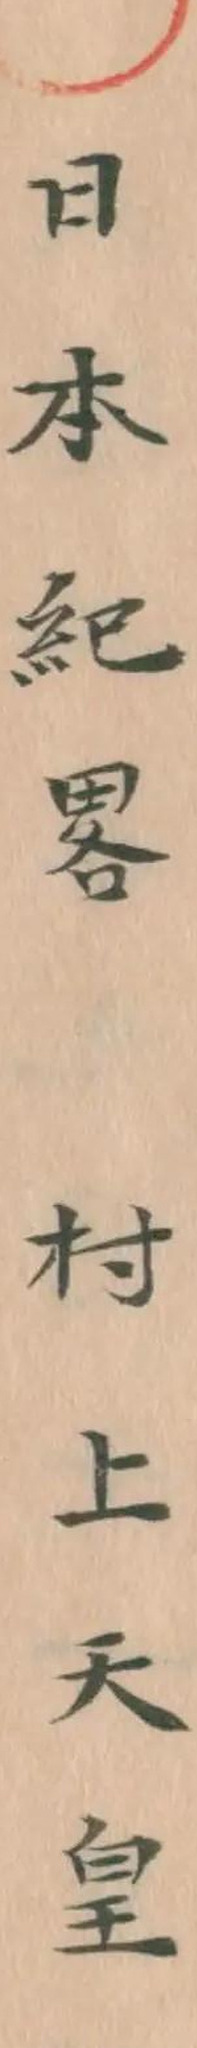○日本紀略村上天皇

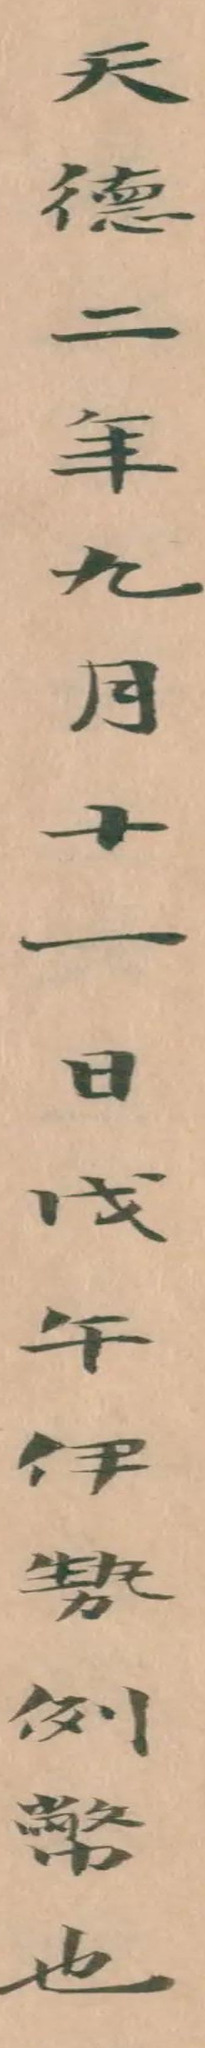天徳二年九月十一日戊午伊勢例幣也
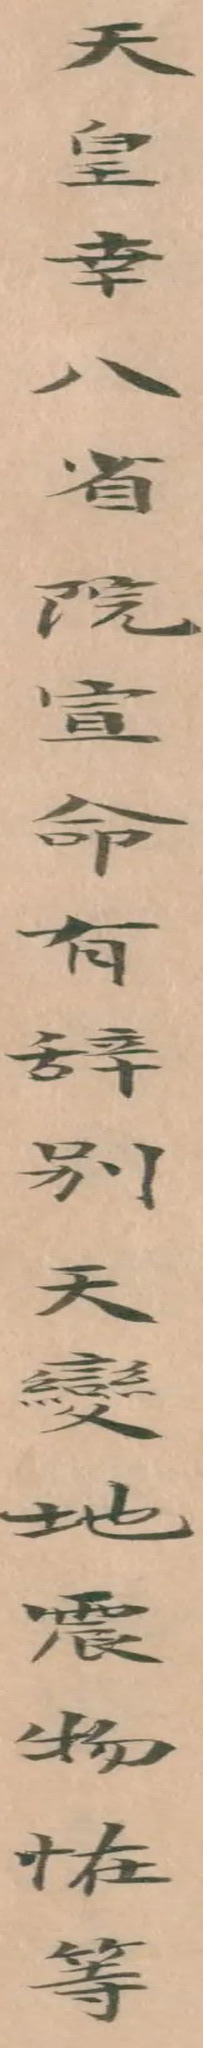天皇幸八省院宣命有辞別天変地震物恠等
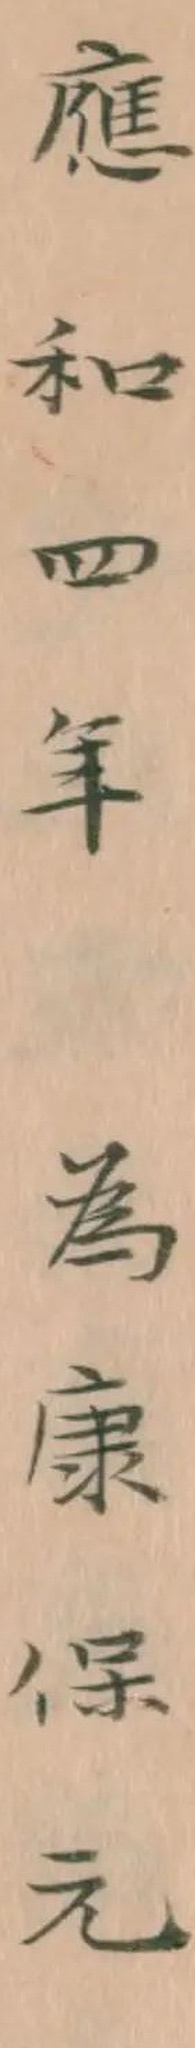応和四年為康保元
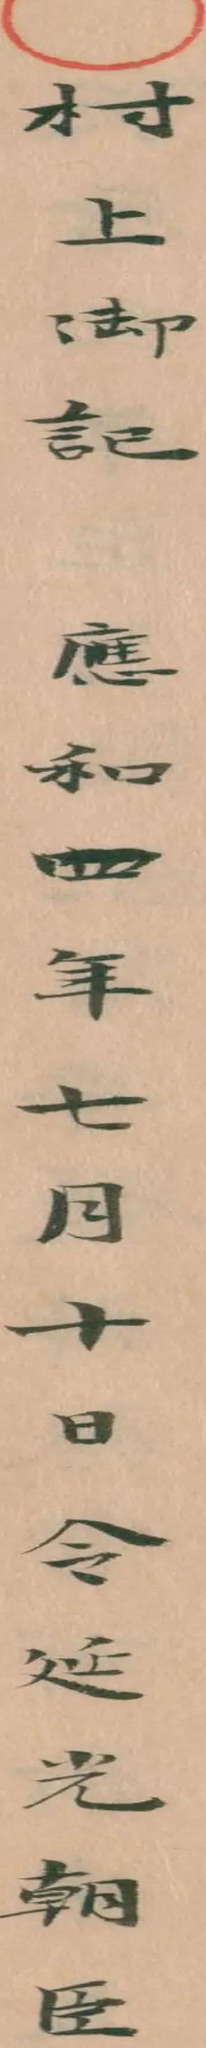○村上御記応和四年七月十日令延光朝臣
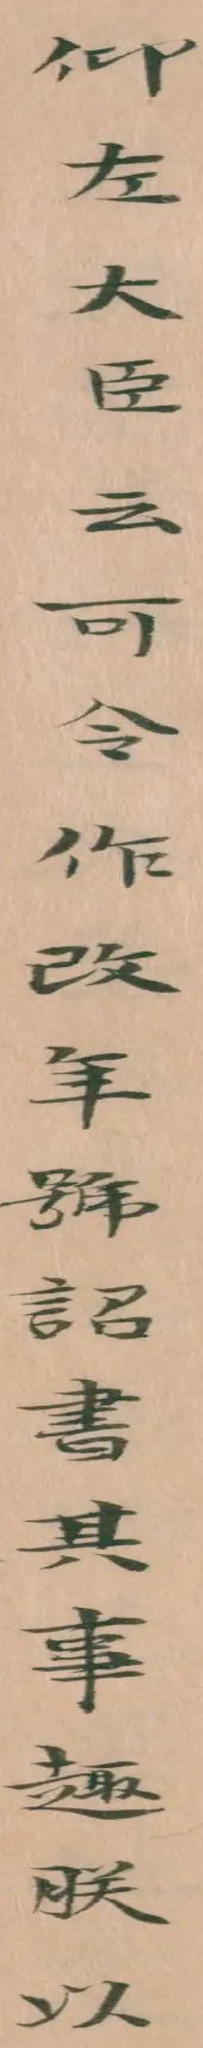仰左大臣云可令作改年号詔書其事趣朕以
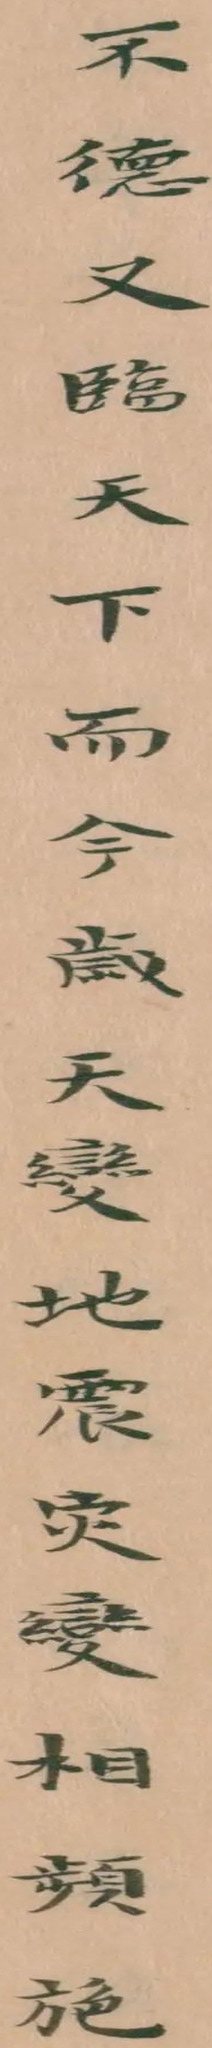不徳又臨天下而今歳天変地震灾変相頻施
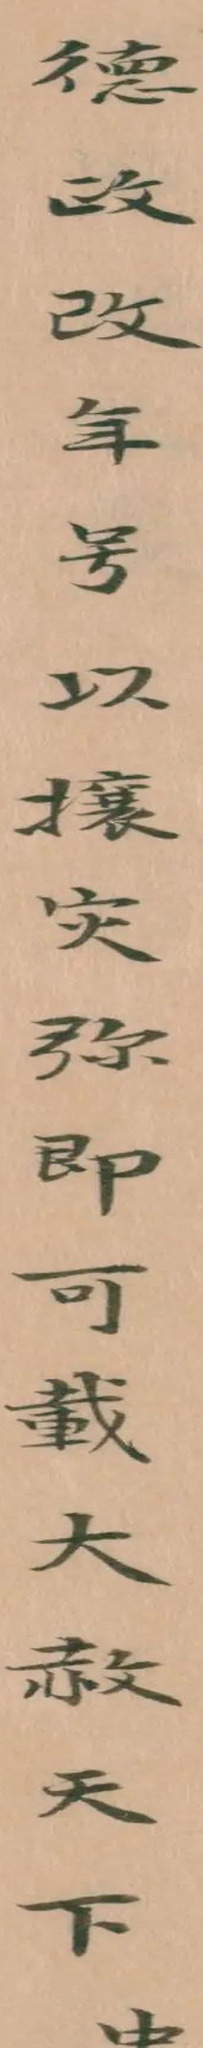徳政改年号以攘灾弥即可載大赦天下中略
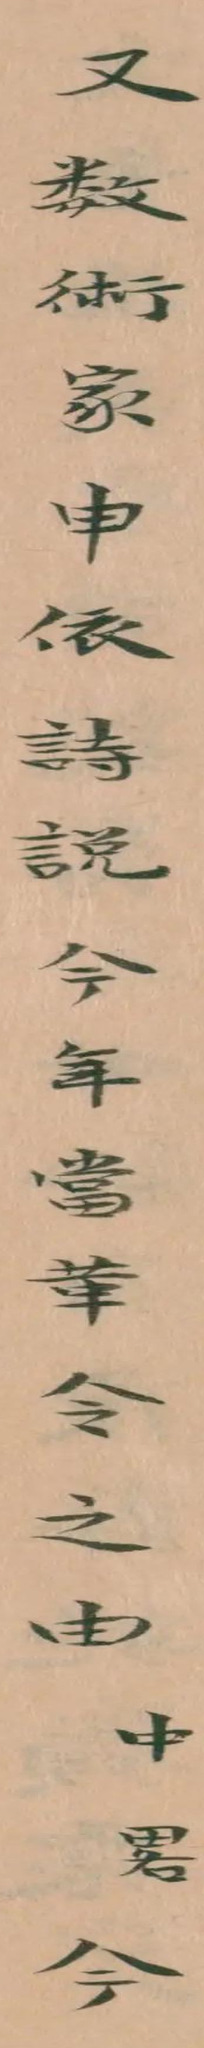又数術家申依詩説今年当革令之由中略今
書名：地災撮要. 巻5-6(地震之部)
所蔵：国立国会図書館 National Diet Library, JAPAN
